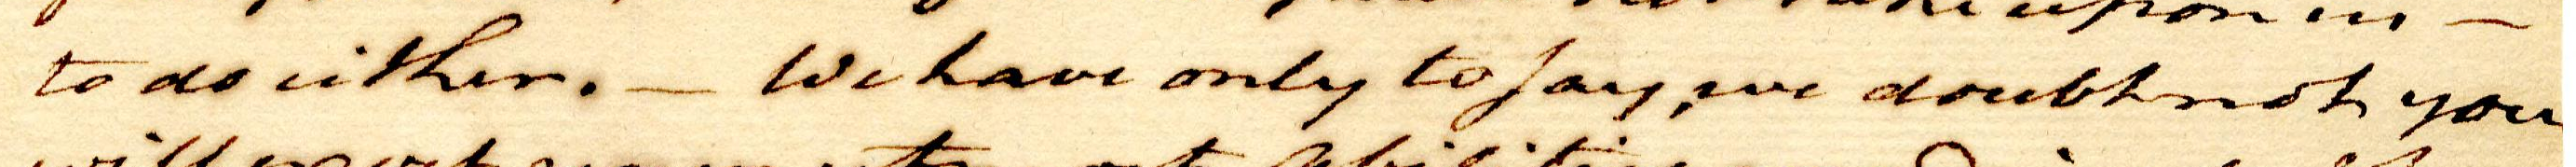to do either. We have only to say we doubt not you
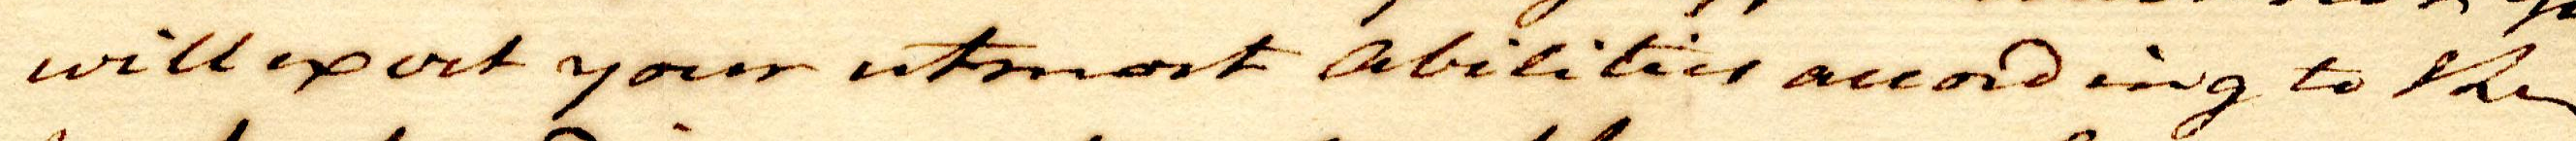will exert your utmost Abilities according to the
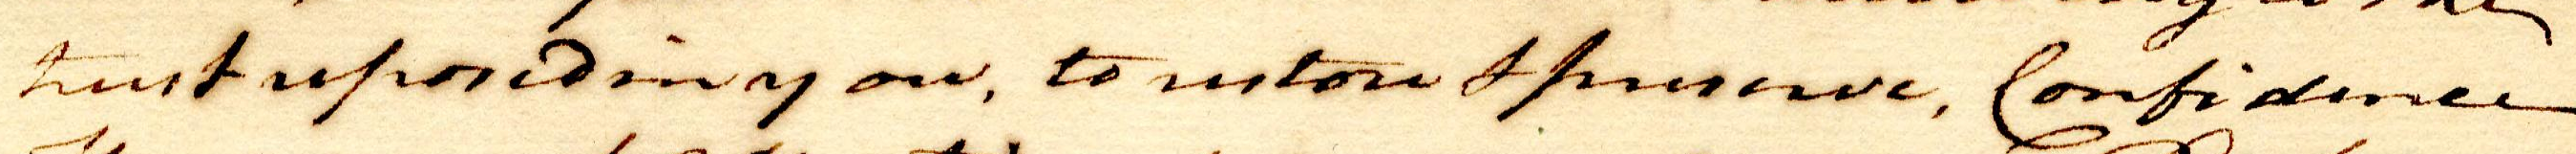trust responding on to restore & preserve Confidence
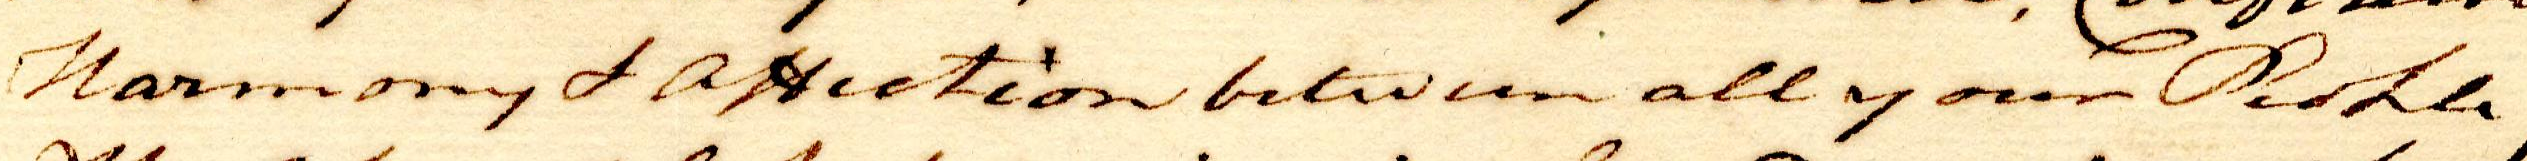Harmony & Affection between all your People
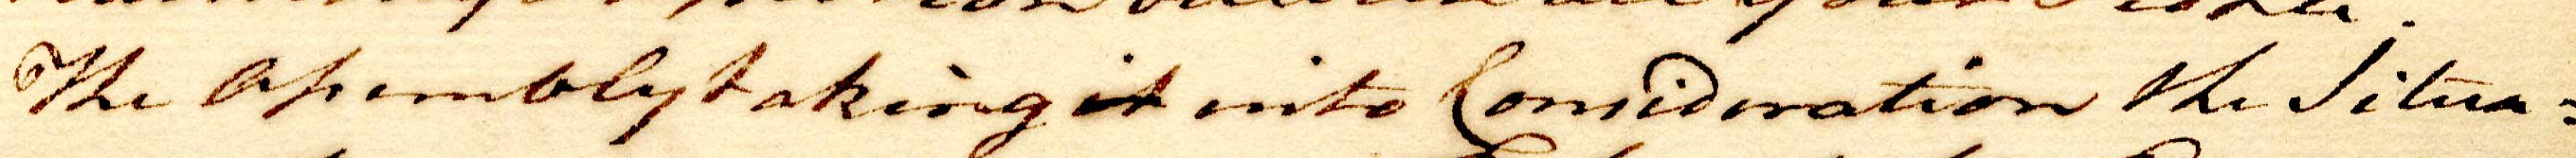The assembly taking it into Consideration the Situa-
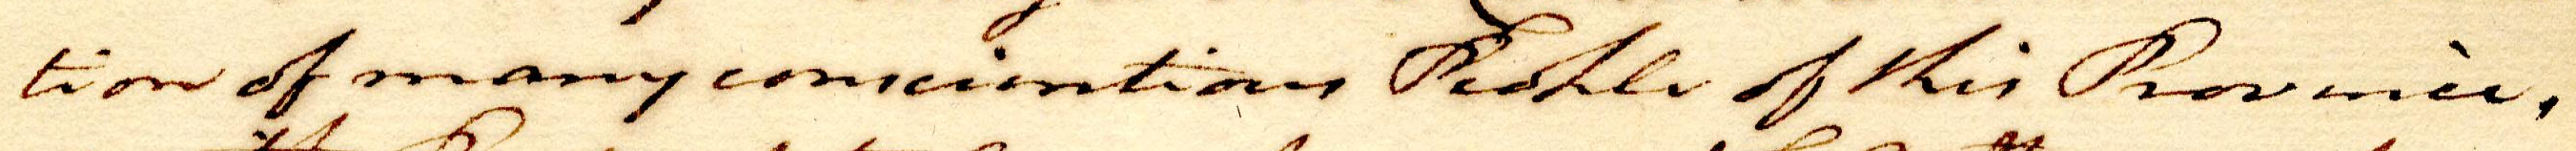-tion of many conscientious People of this Province
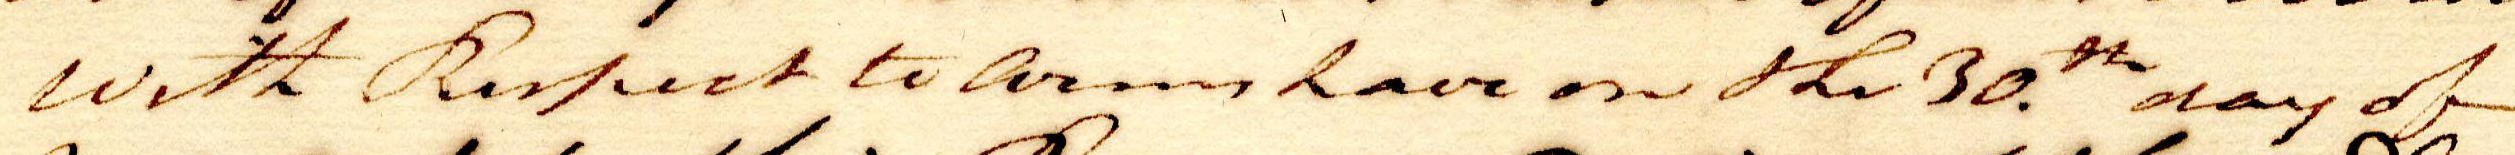With Respect to Arms have on the 30^th day of
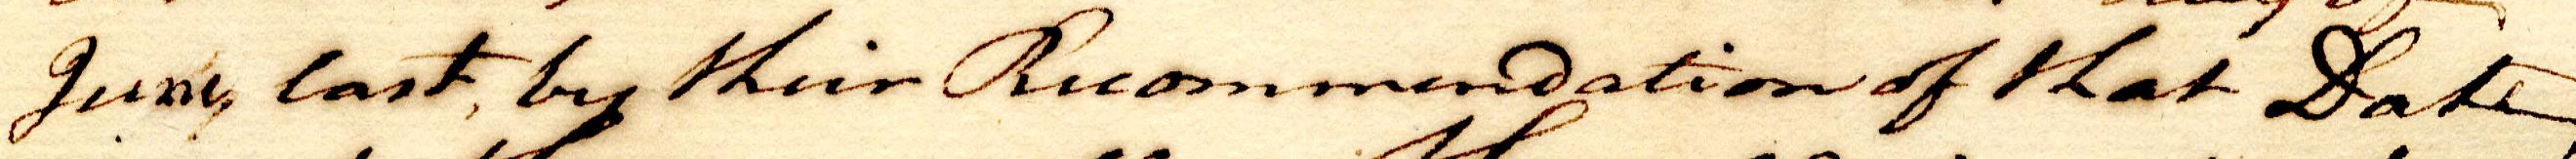June last, by their Recommendation of that Date,
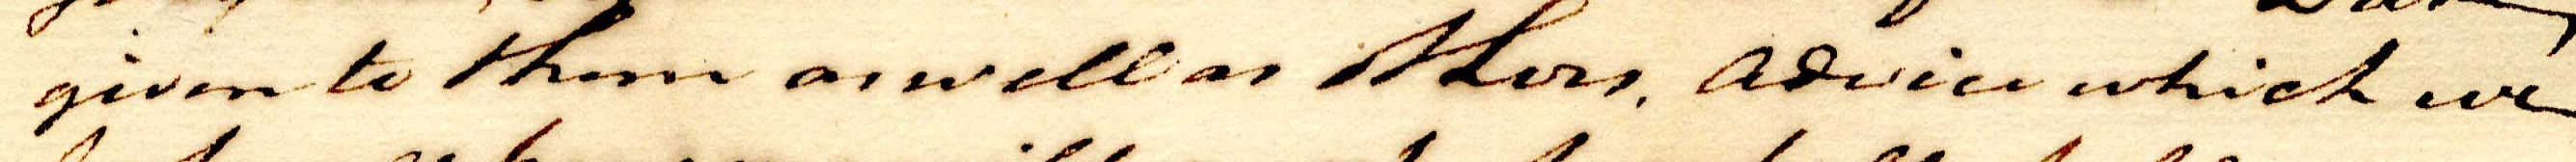given to them as well as others, Advice which we
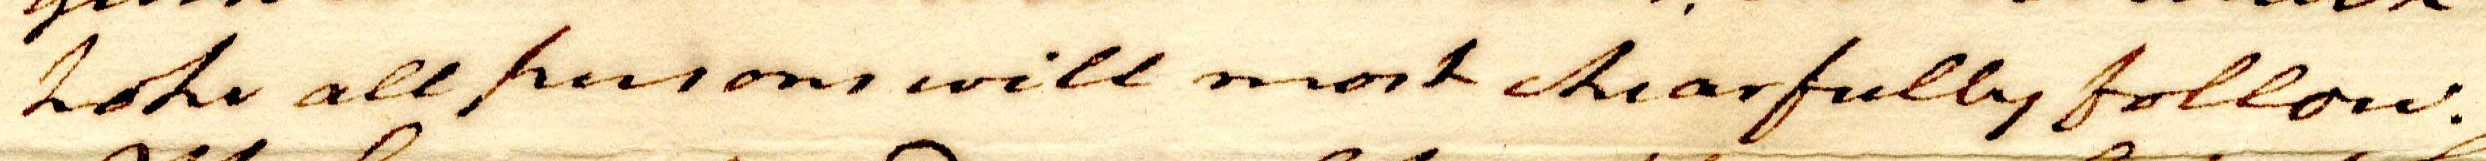hope all persons will most chearfully follow.
